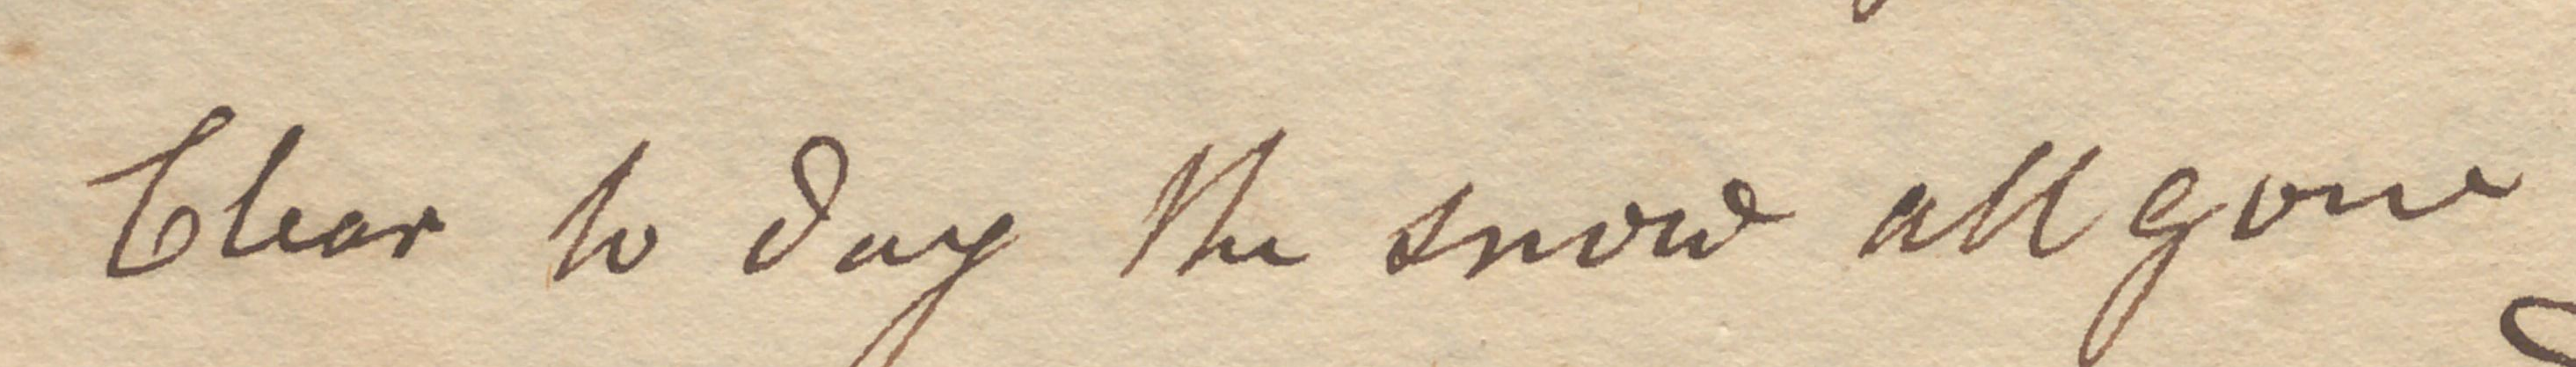Clear to day the snow all gone
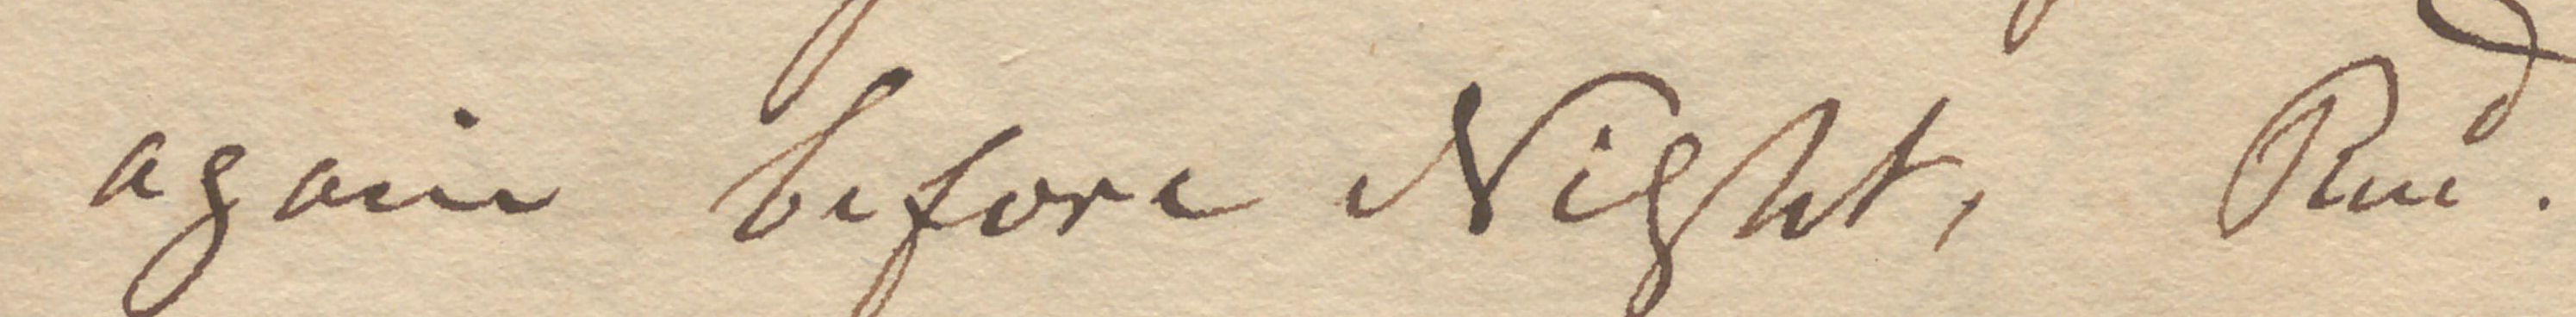again before Night, Rec^d
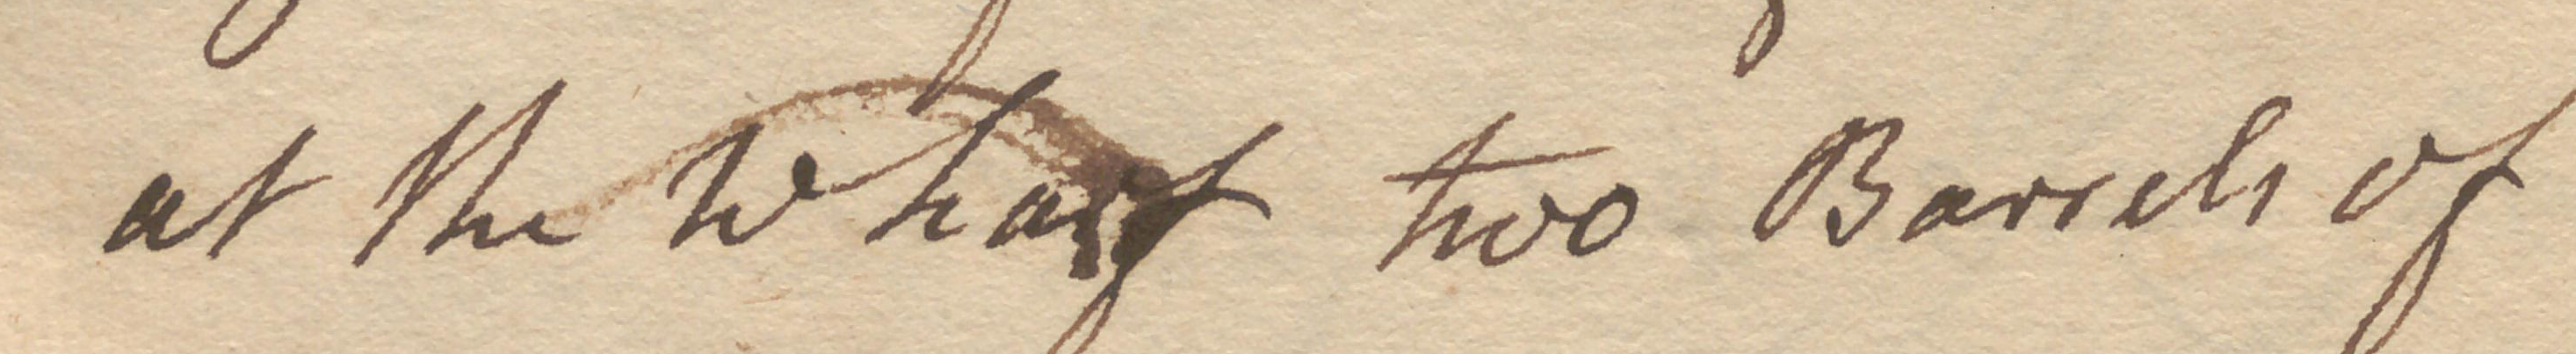at the wharf two Barrels of
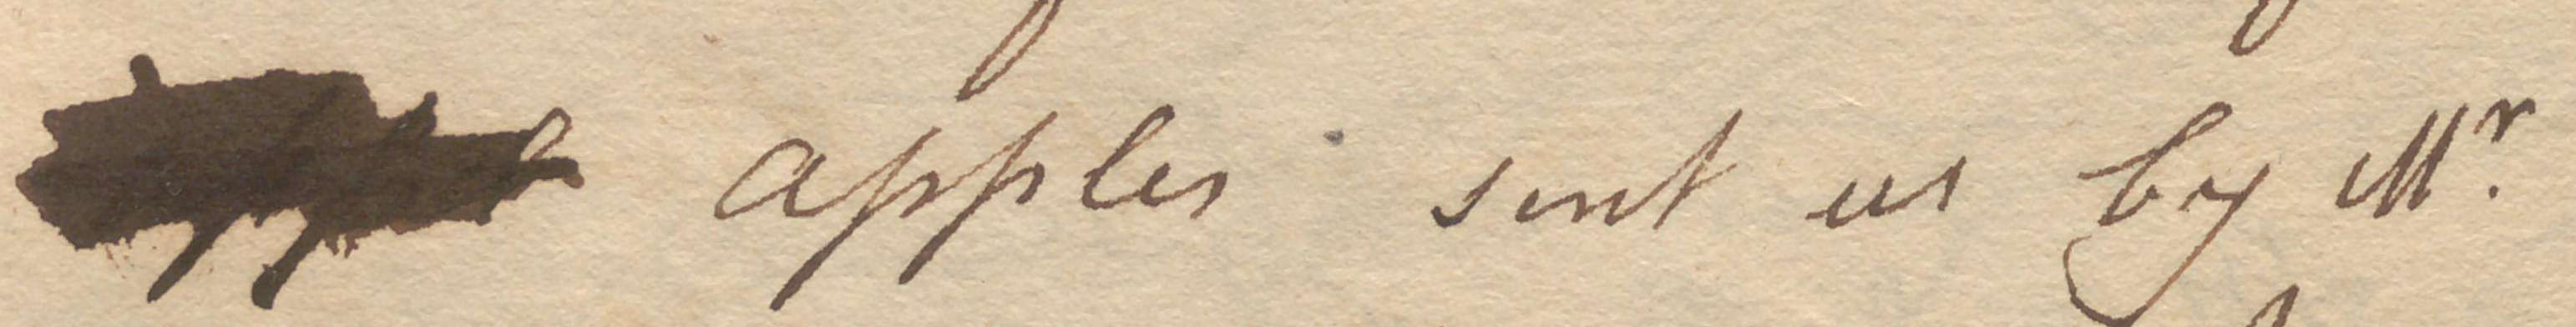[appel] Apples sent us by M^r.
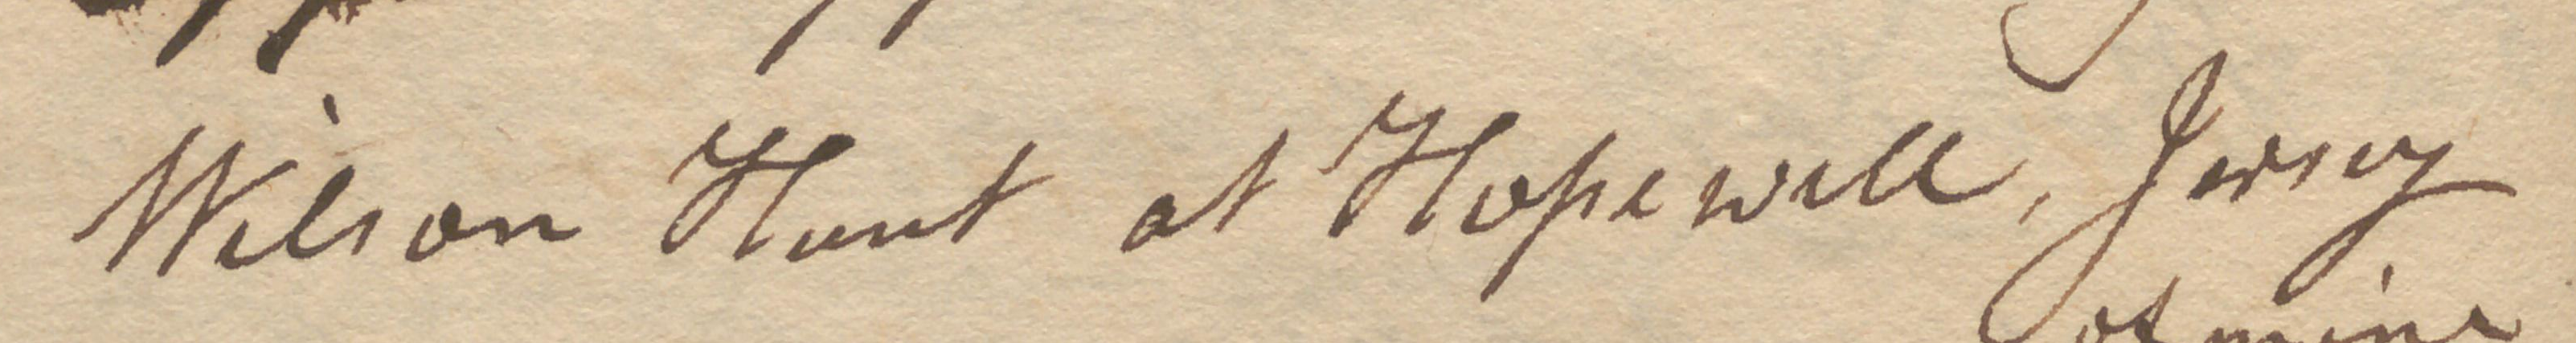Wilson Hunt at Hopewell, Jersey
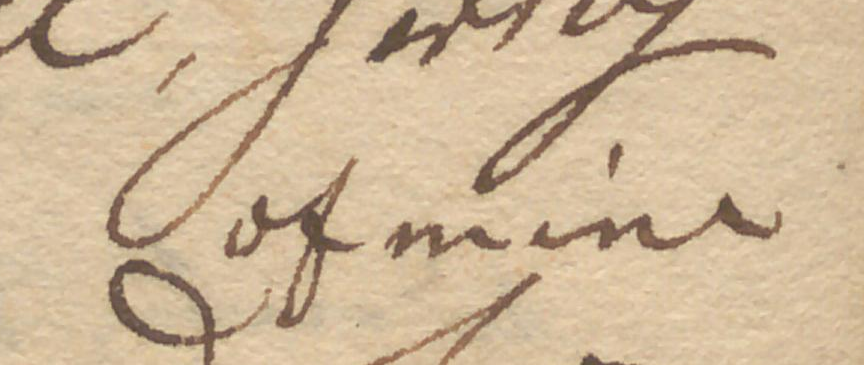of mine
